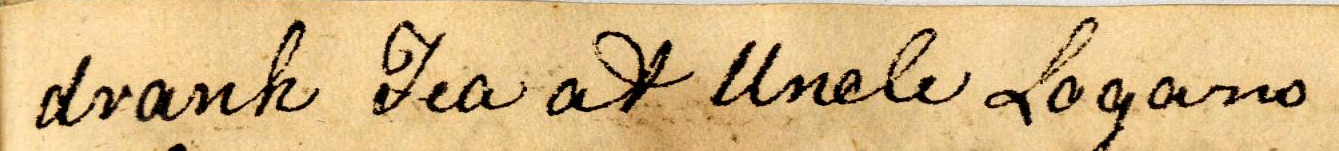drank Tea at Uncle Logans
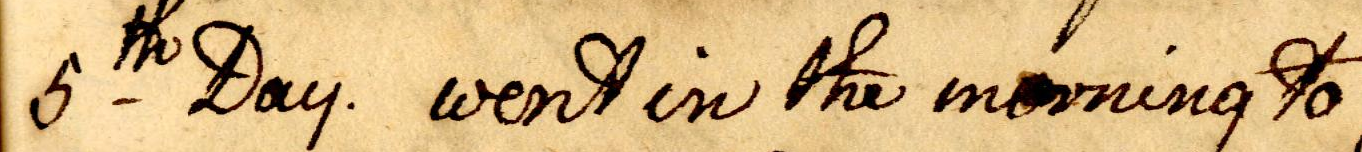5^th Day. went in the morning to
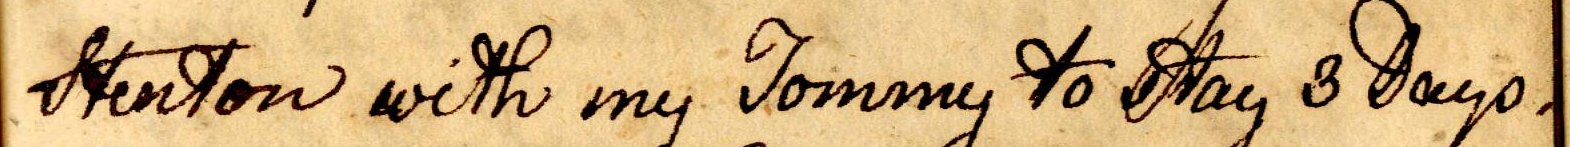Stenton with my Tommy to stay 3 Days.
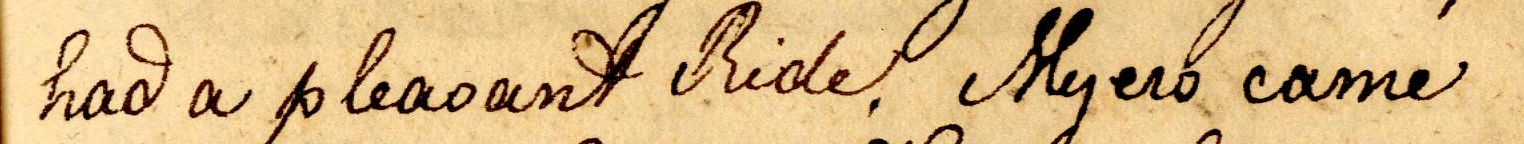had a pleasant Ride. Myers came
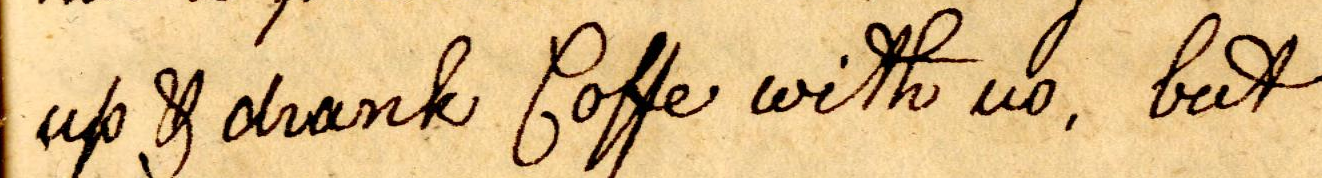up & drank Coffe with us, but
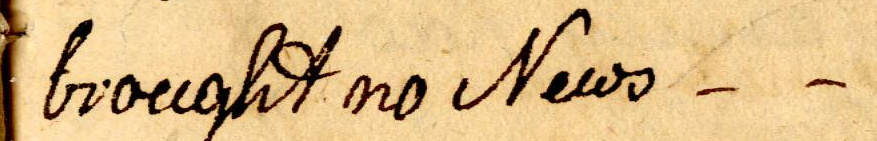brought no News--
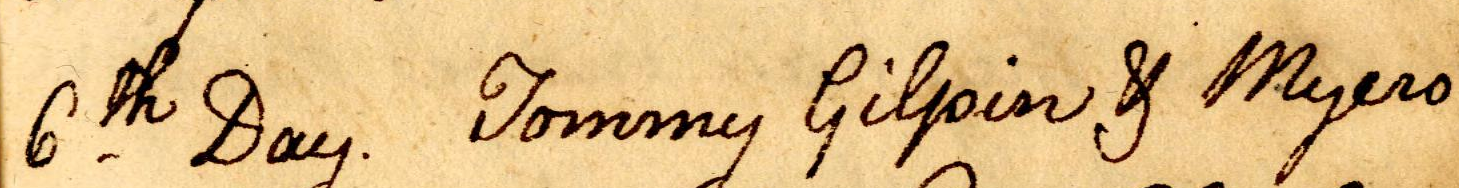6^th Day. Tommy Gilpin & Myers
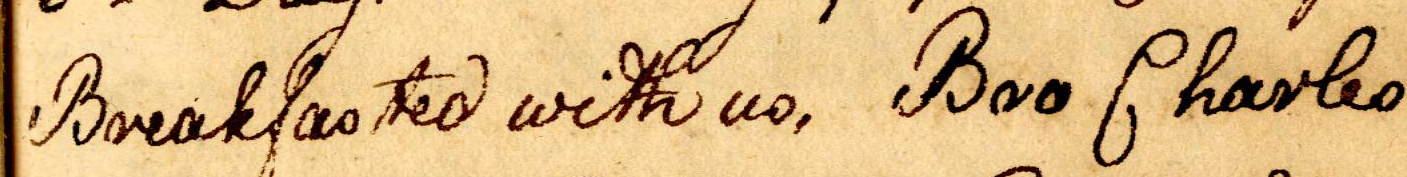Breakfasted with us, Bro Charles
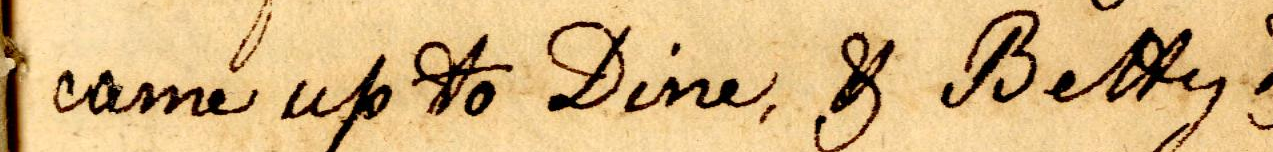came up to Dine, & Betsy &
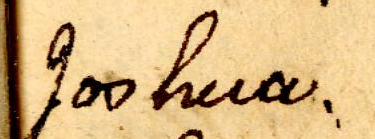Joshua. -
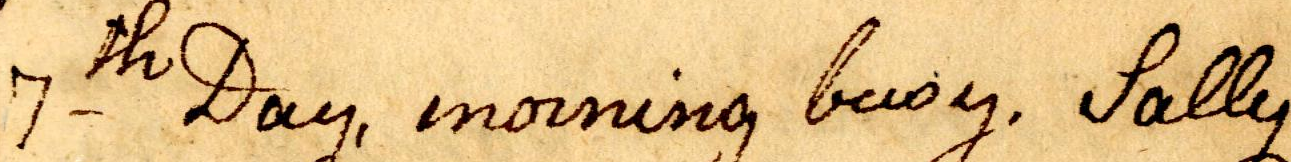7^th Day, morning busy, Sally
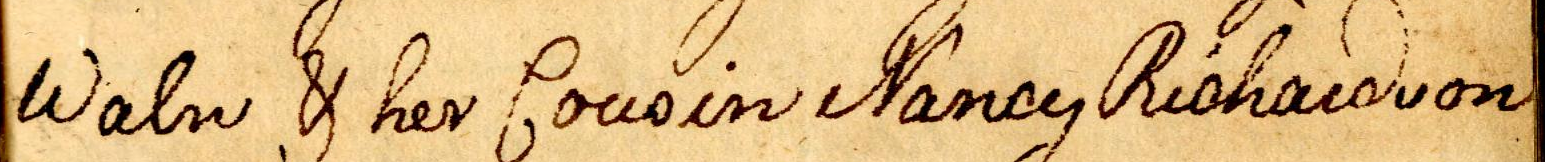Waln & her Cousin Nancy Richardson
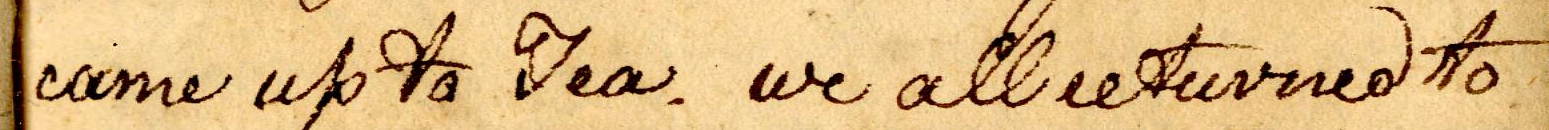came up to Tea. we all returned to
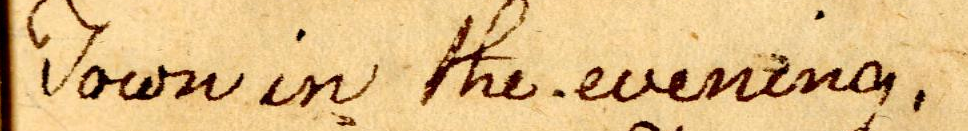Town in the evening.
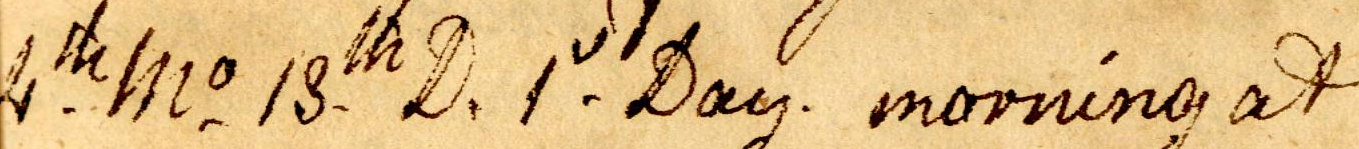4^th M^o 13^th D. 1^st Day. morning at
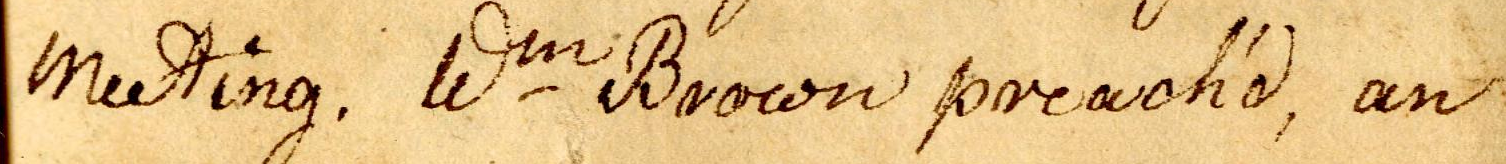Meeting, W^m Brown preach'd, an
